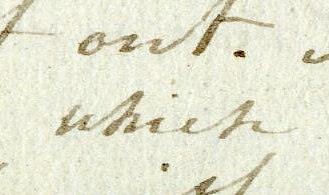which
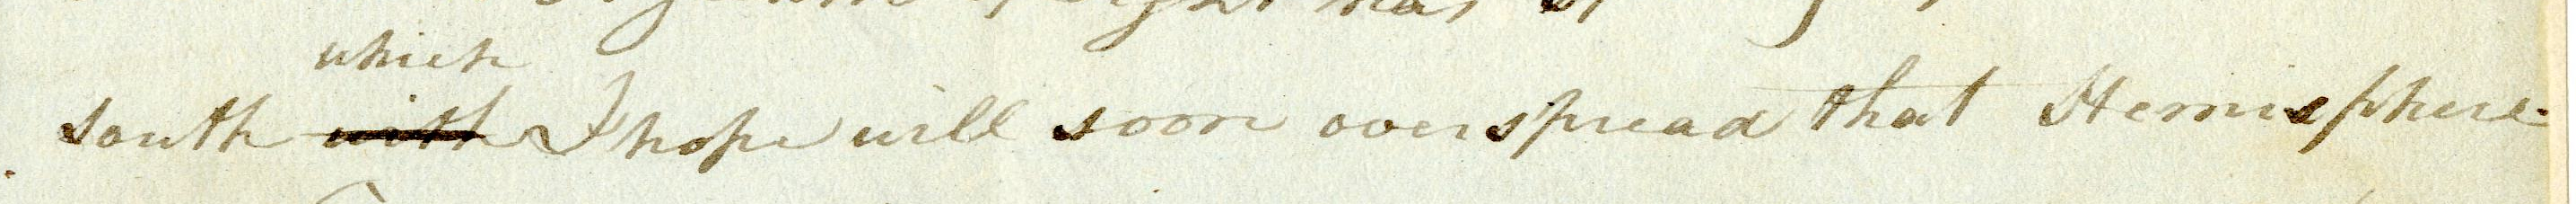south [with] I hope will soon overspread that Hemisphere.
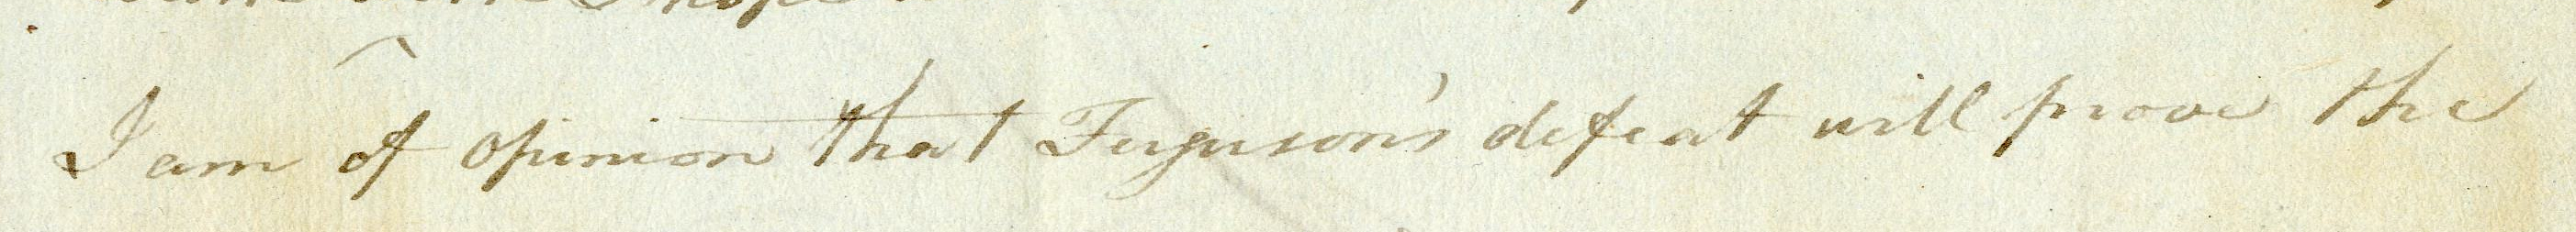I am of opinion that Ferguson's defeat will prove the
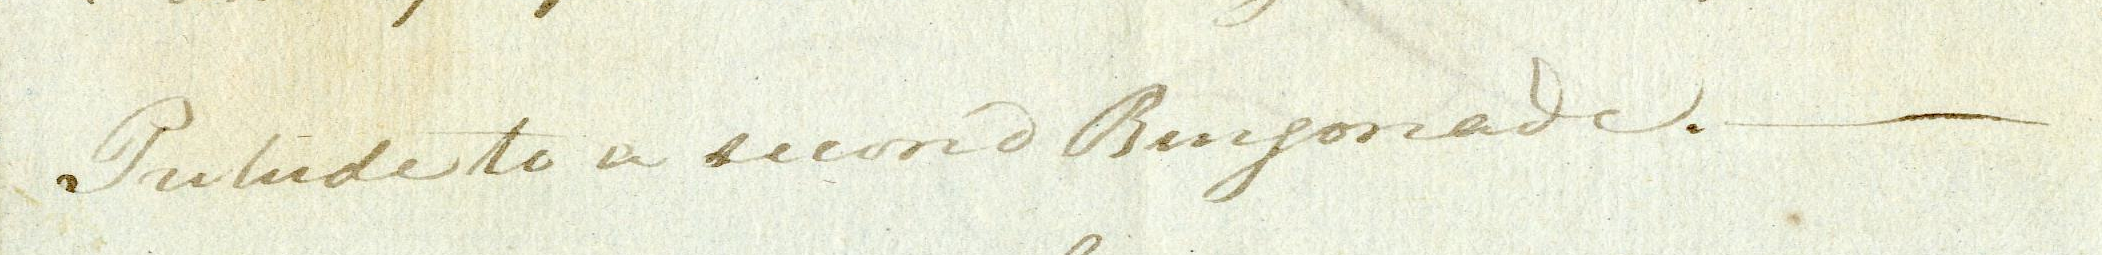Prelude to a second Burgonade.-
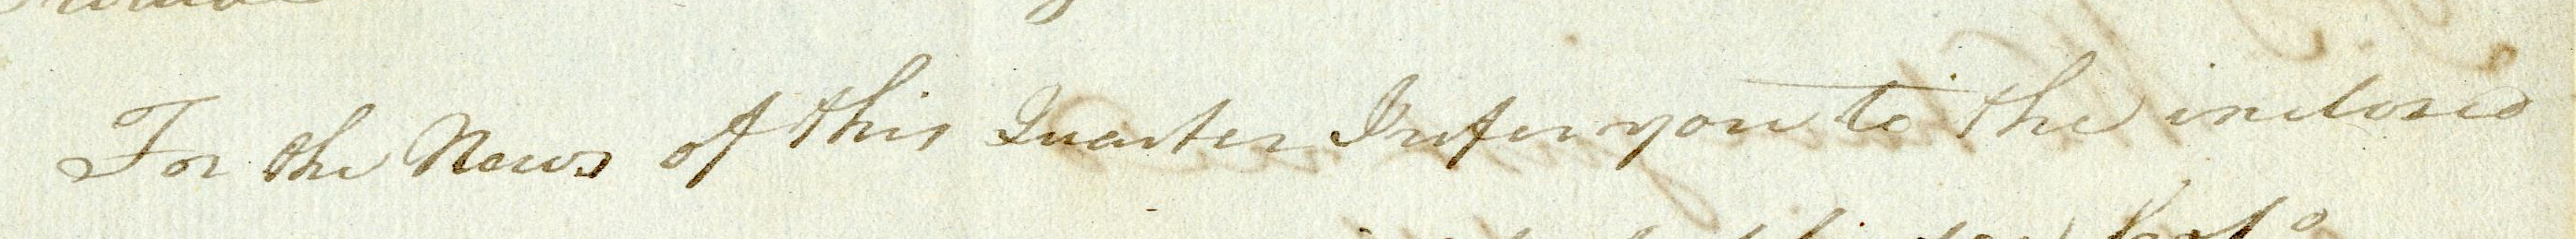For the News of this Quarter I refer you to the inclosed
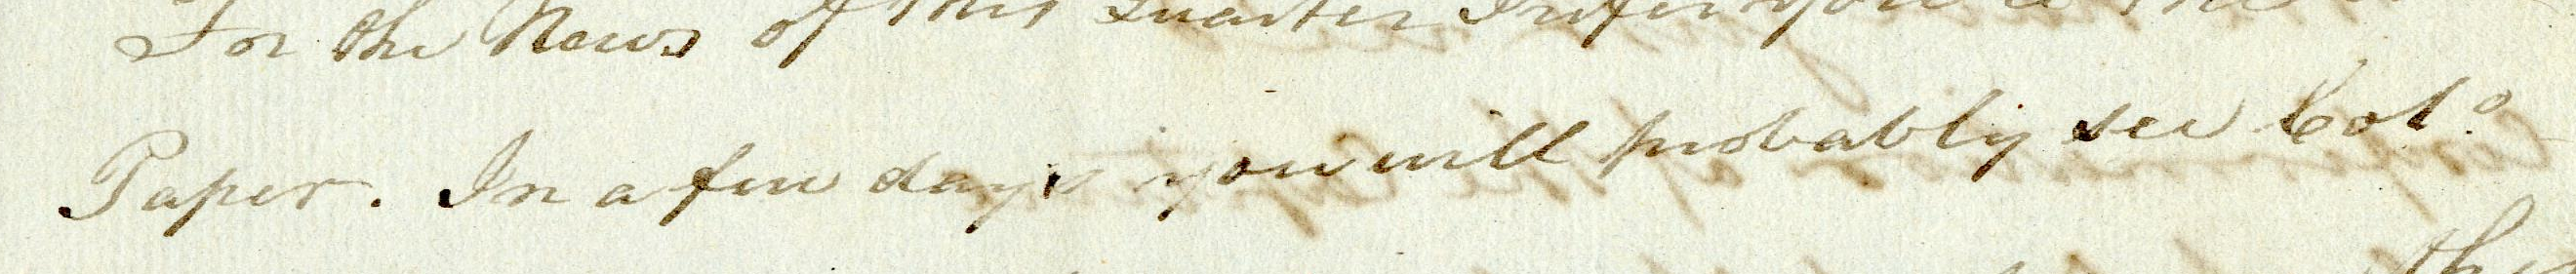Paper. In a few days you will probably see Col^o.
